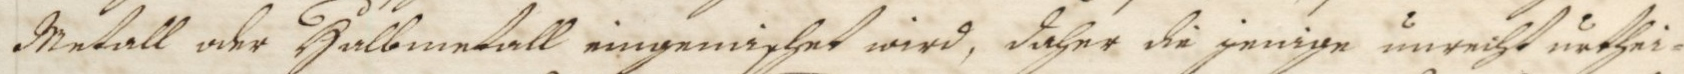Metall oder Halbmetall eingemischet wird, daher die jenige unrecht urthei-
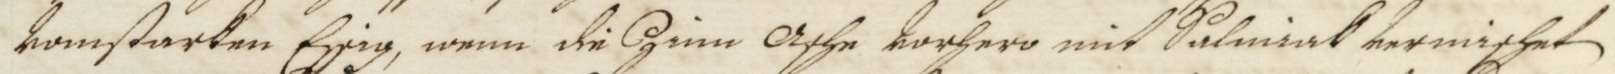vomstarken Essig, wenn die Zim Asche vorhero mit Salmiak vermischet
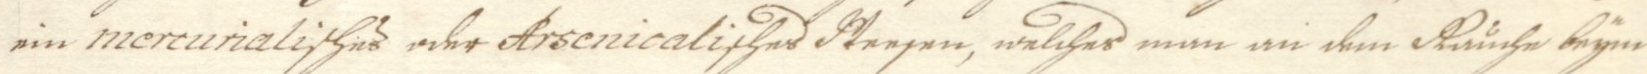ein mercurialisches oder Arsenicalisches Weesen, welches man an dem Rauche beym
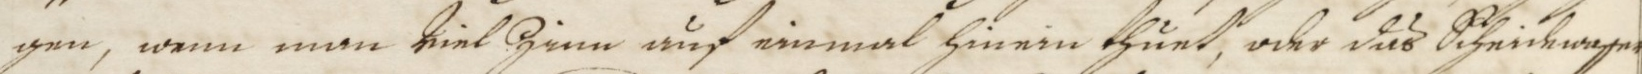gen, wenn man viel Zinn auf einmal hinein thuet, oder das Scheidewasser
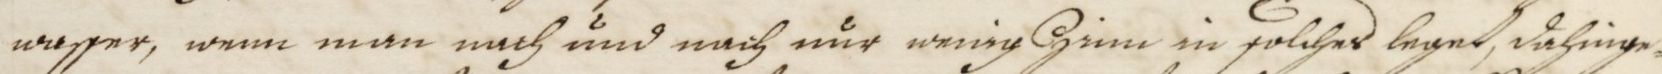wasser, wenn man nach und nach nur wenig Zinn in solches leget, dahinge-
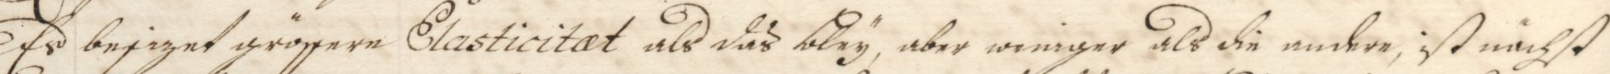Es besizet grössere Elasticitaet als das Bley, aber weniger als die andere, ist nächst
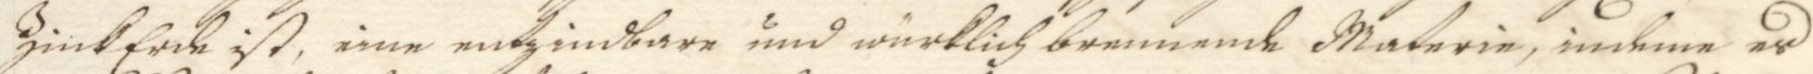Zink Erde ist, eine entzindbare und würklich brennende Materie, indeme es
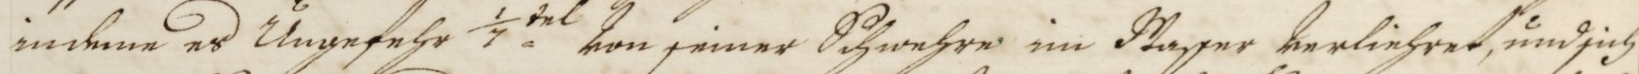indeme es Ungefehr 1/7tel von seiner Schwehre im Wasser verliehret, und sich
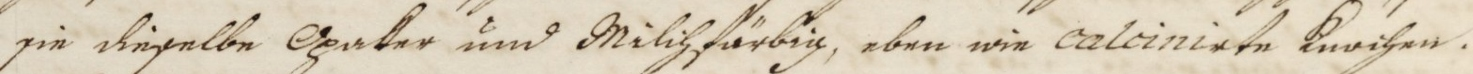sie dieselbe Opaker und Milchfärbig, eben wie calcinirte Knochen.
